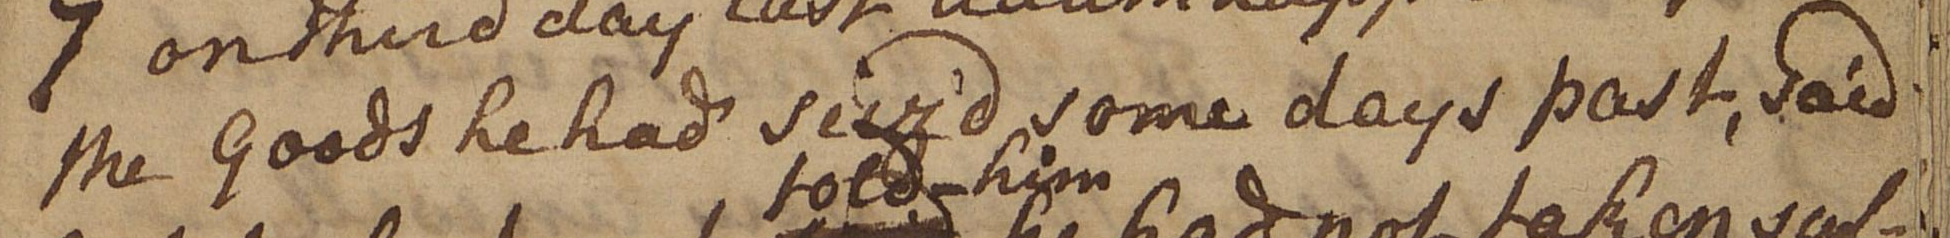the Goods he had seiz'd some days past, said
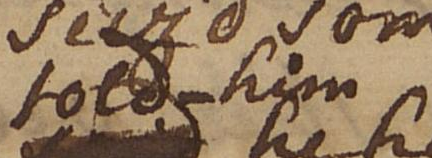told- him
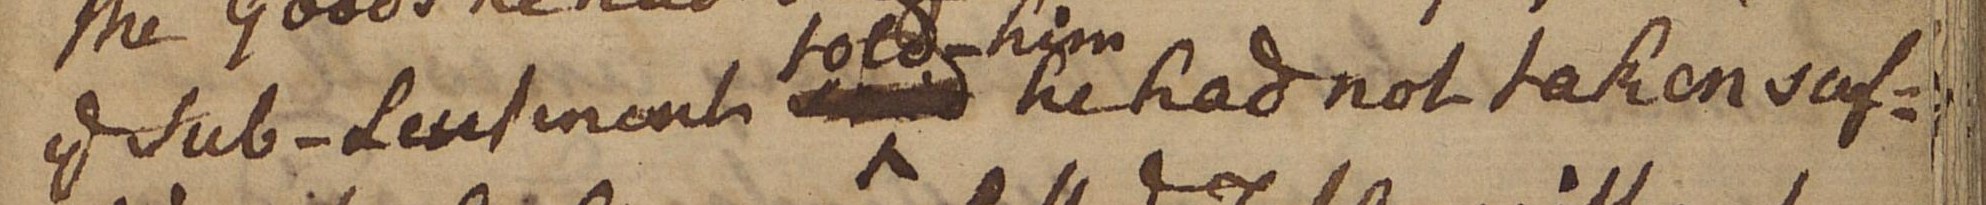y^e sub- Leutenant [___] ^ he had not taken suf-
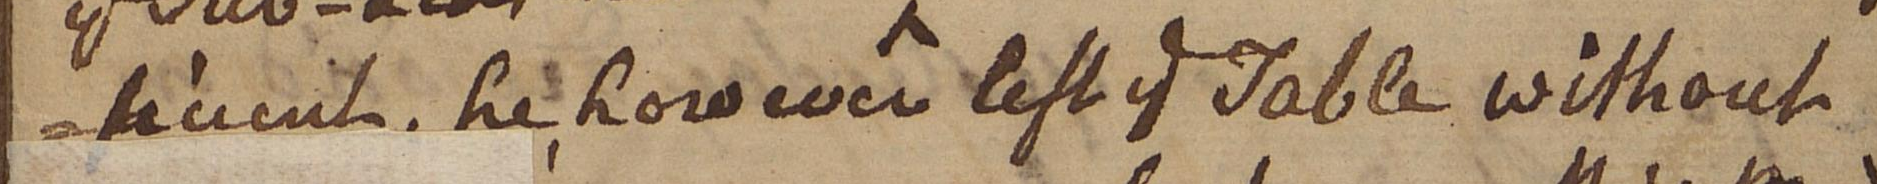-ficient, he how ever left y^e Table without
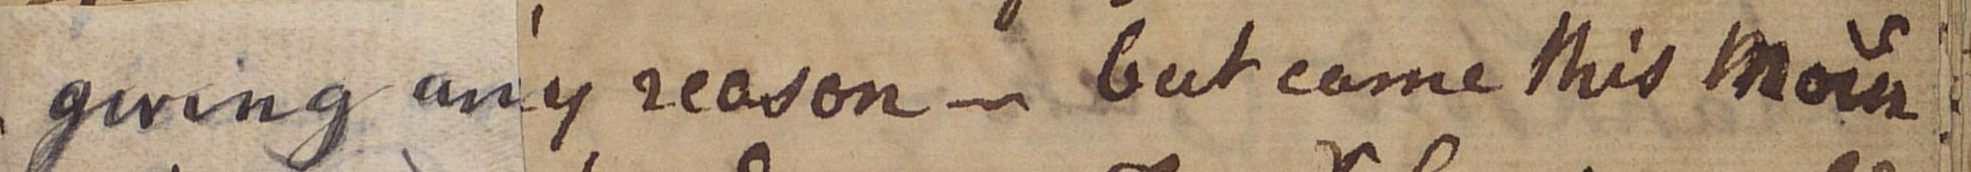giving any reason- but came this Morn^g
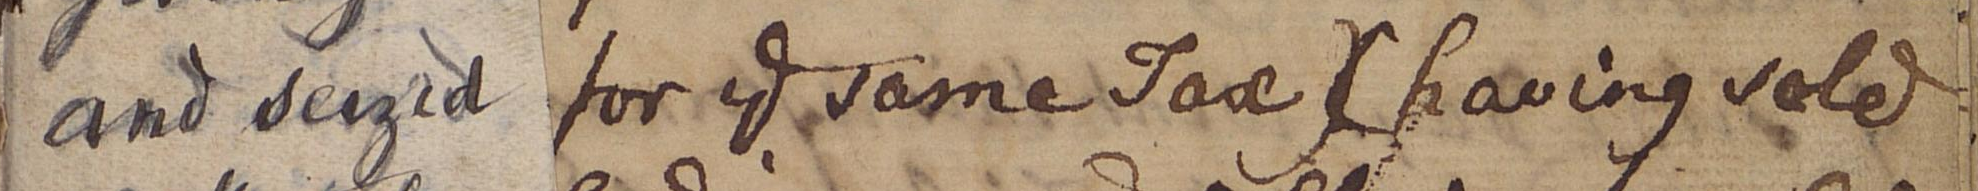and seized for y^e same Tax (having sale
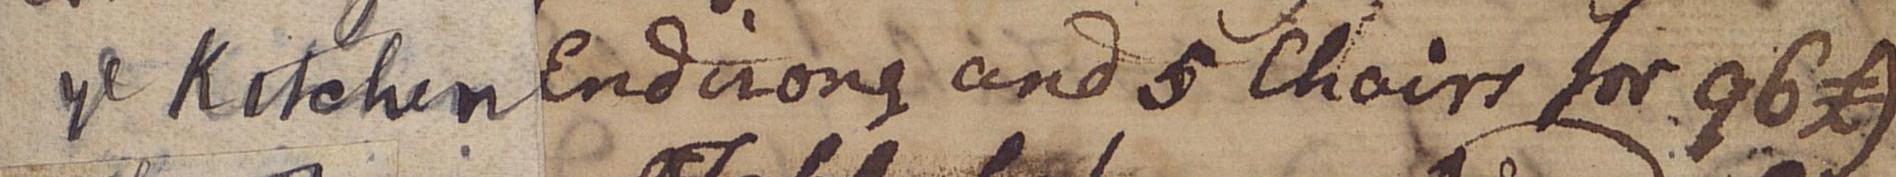y^e Kitchen Endirons and 5 Chairs for 96[_])
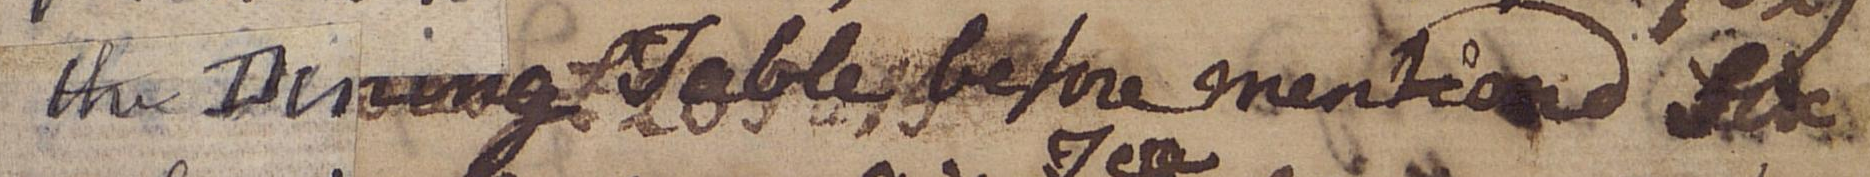the Dining Table before mentiond Six
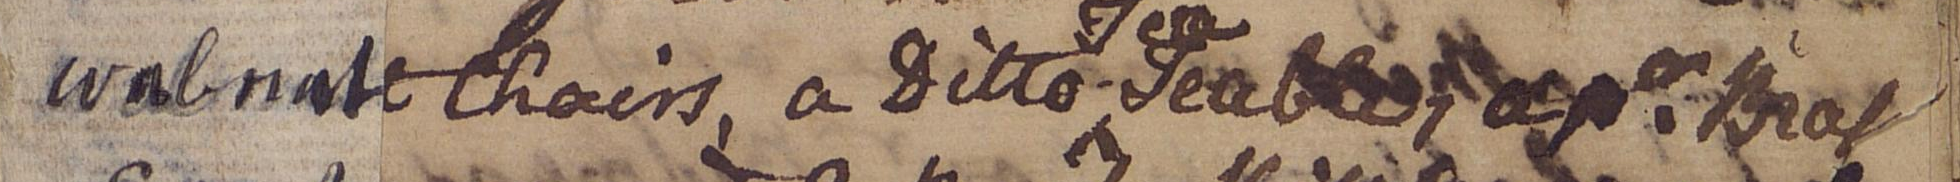walnutt Chairs, a Ditto ^Tea Table, a p^r Bras
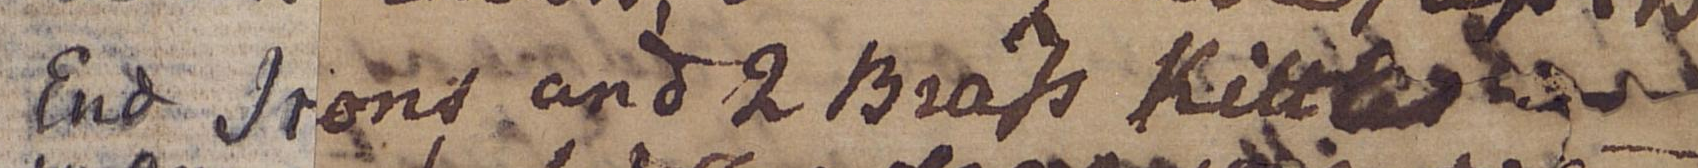End Irons and 2 Brass Kittles
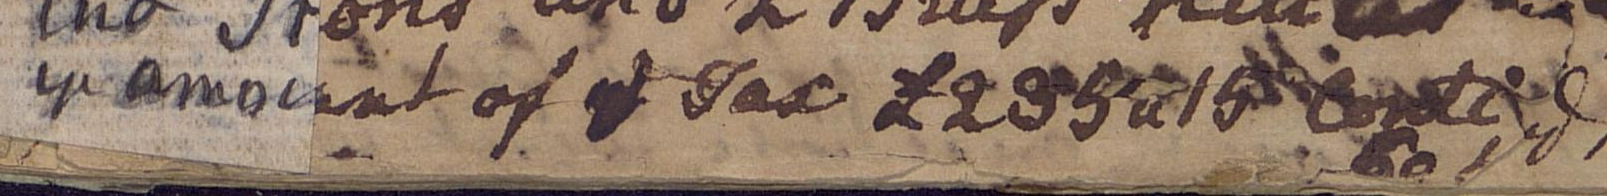y^e amount of y^e Tax £235 u 15 Conti
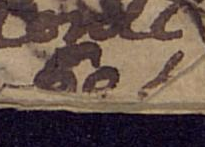50s
